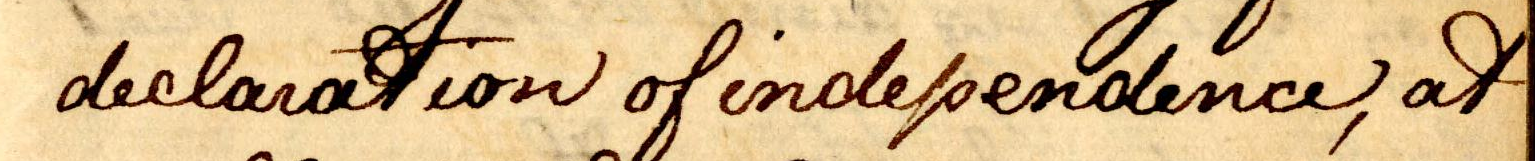declaration of independence, at
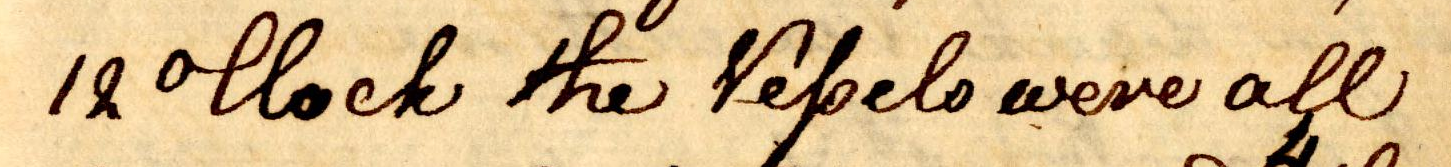12 ^oClock the Vessels were all
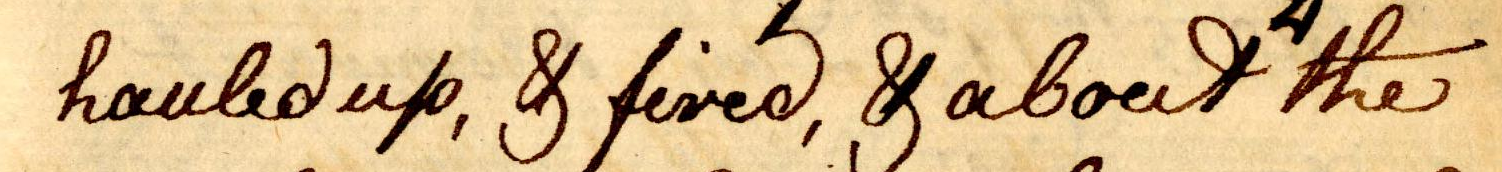hauled up, & fired, & about ^4 the
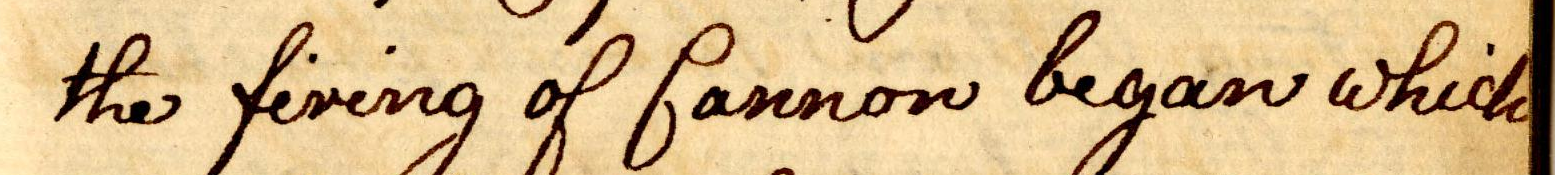the firing of Cannon began which
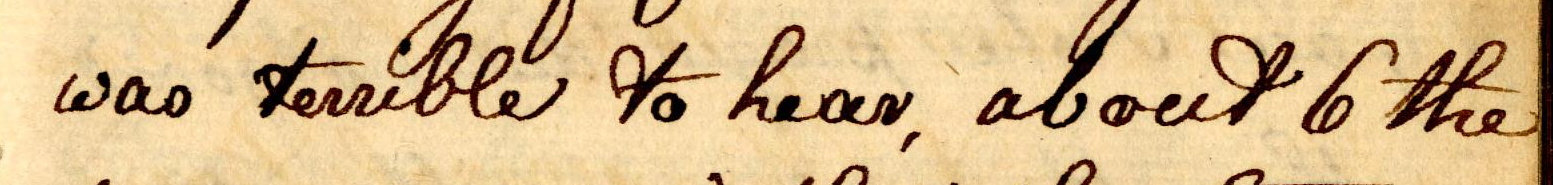was terrible to hear, about 6 the
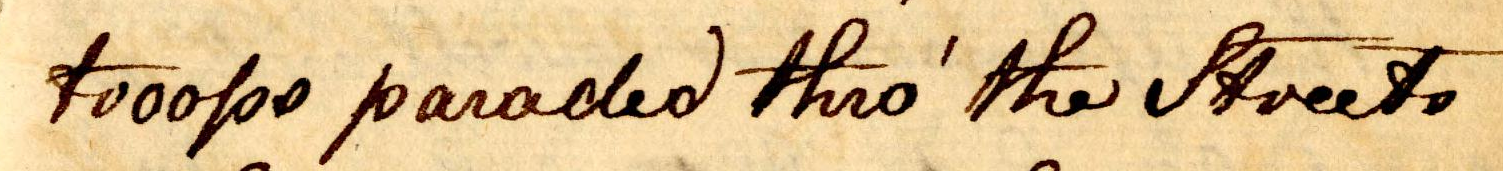troops paraded thro' the Streets
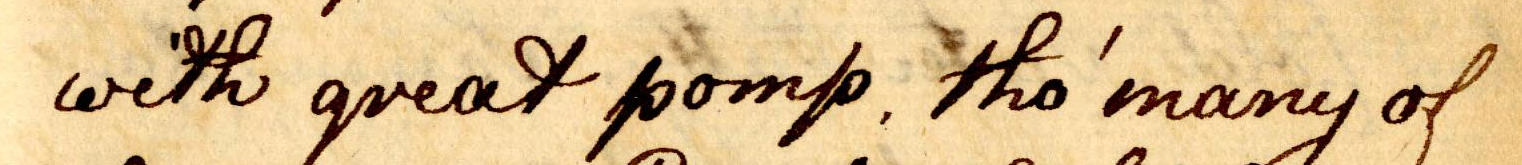with great pomp, tho' many of
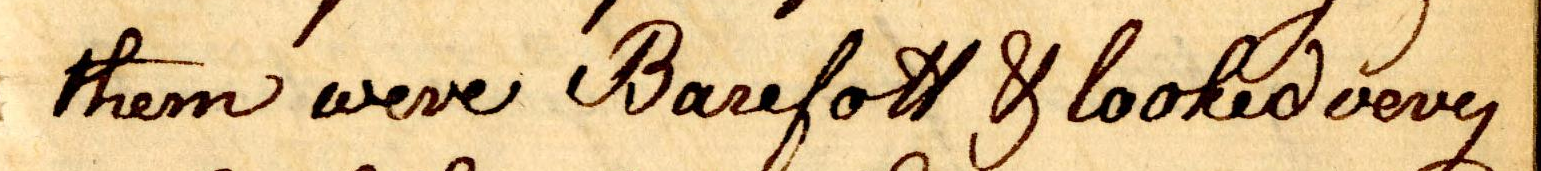them were Barefott & looked very
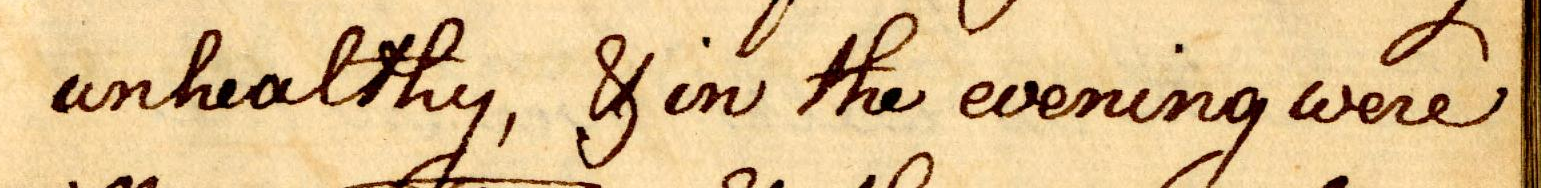unhealthy, & in the evening were
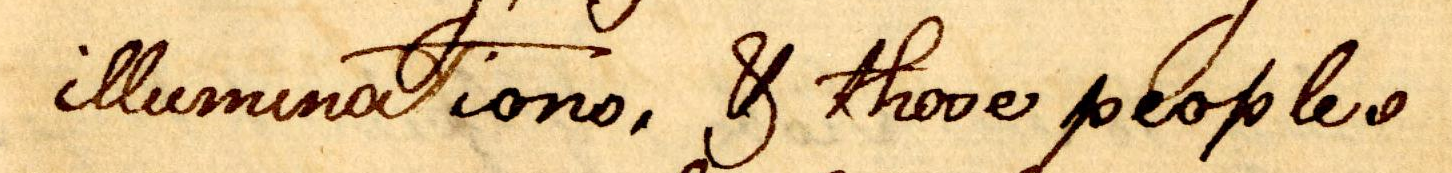illuminations, & those peoples
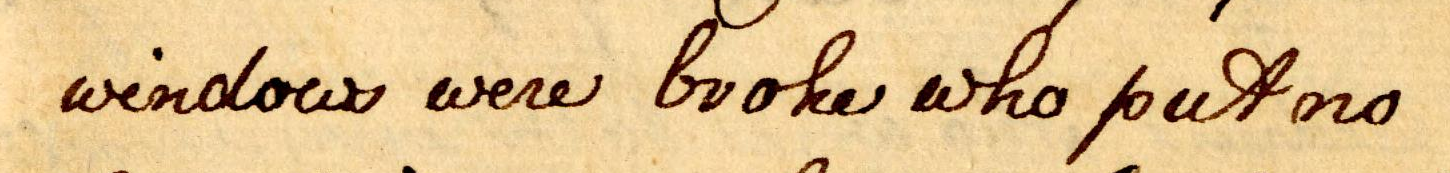windows were broke who put no
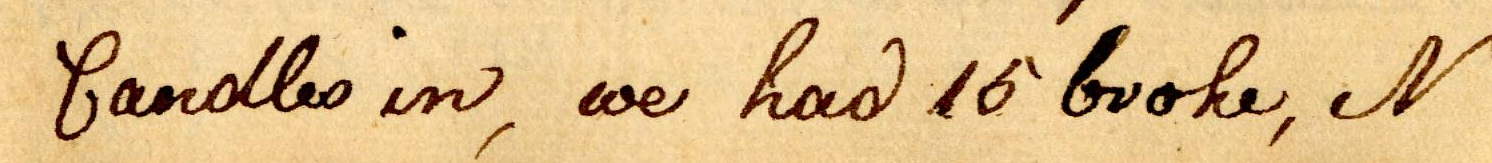Candles in, we had 15 broke, N
